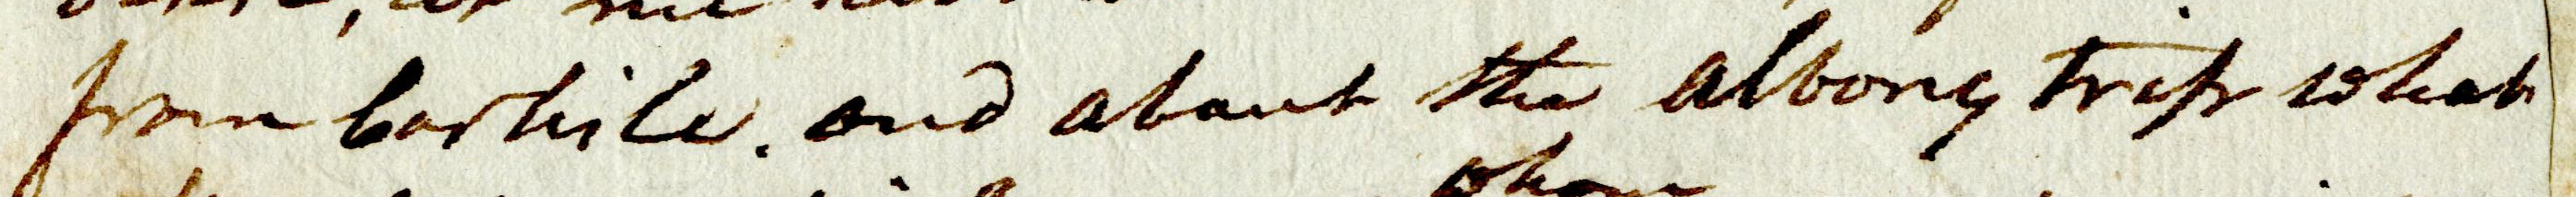from Carlisle and about the albong trip what
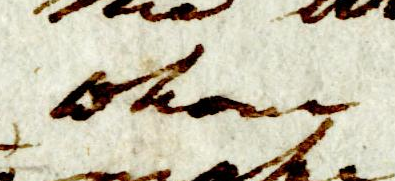where
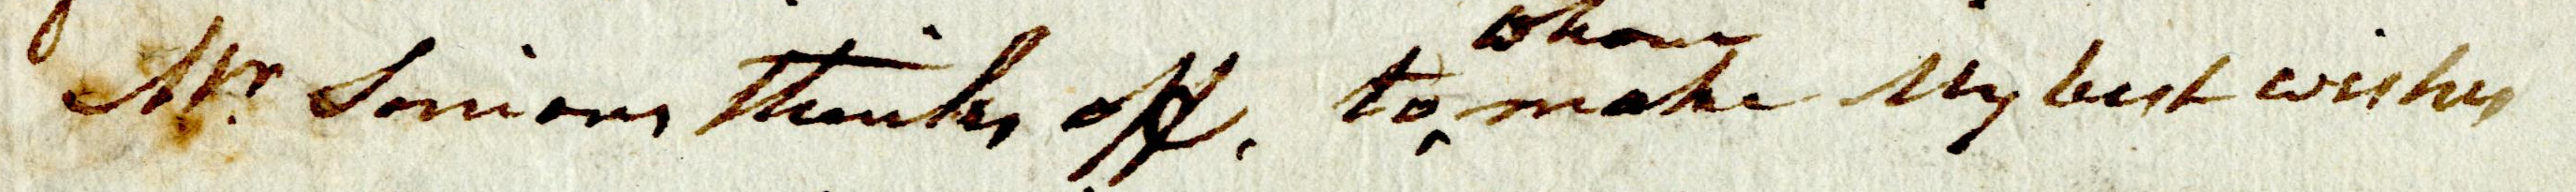M^r Simon thinks off to ^ make My best wishes
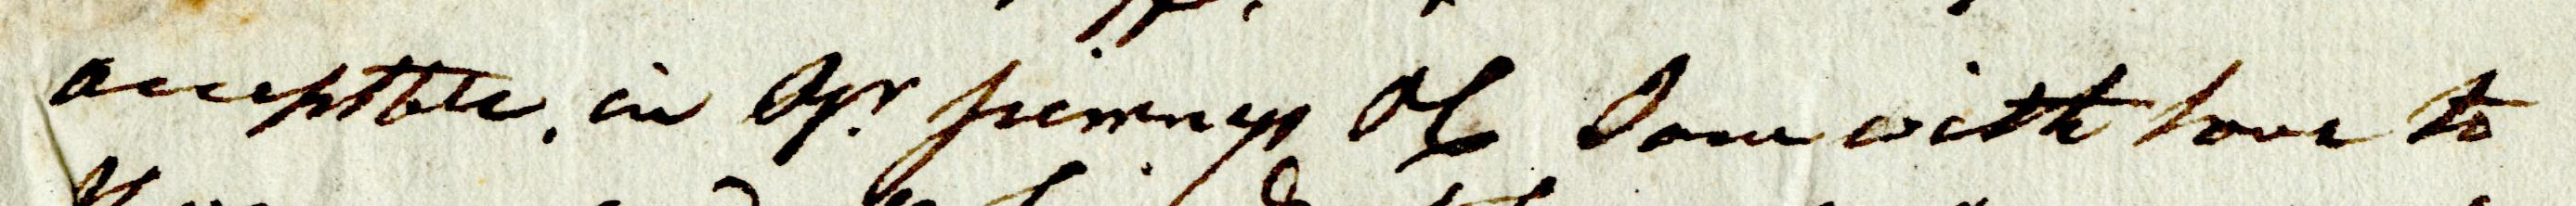acceptble, in y^r. Fremnys &C I am with love to
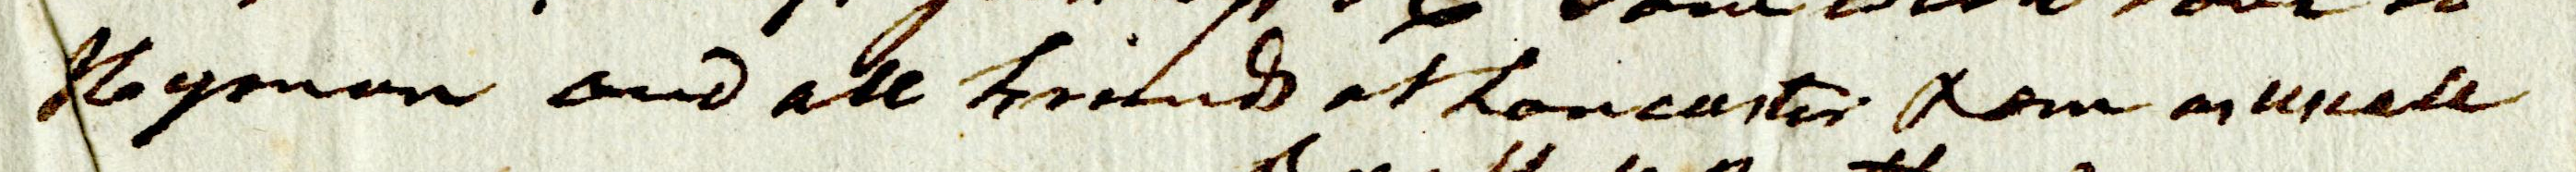& Simon and all friends at Lancaster. & as usuall
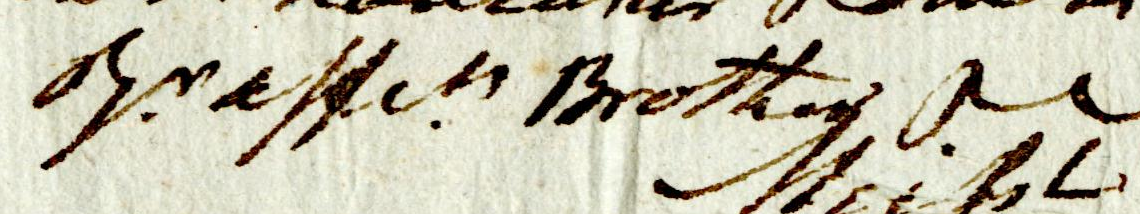y^r. affec^t. Brother &^c
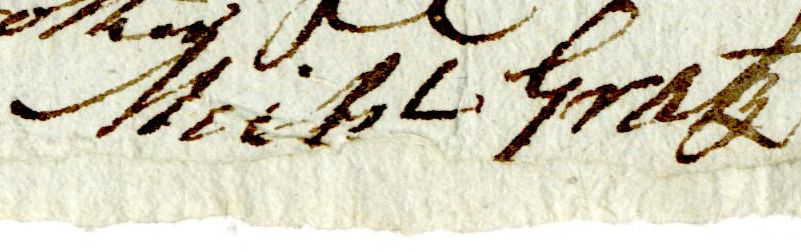Mich^l Gratz
